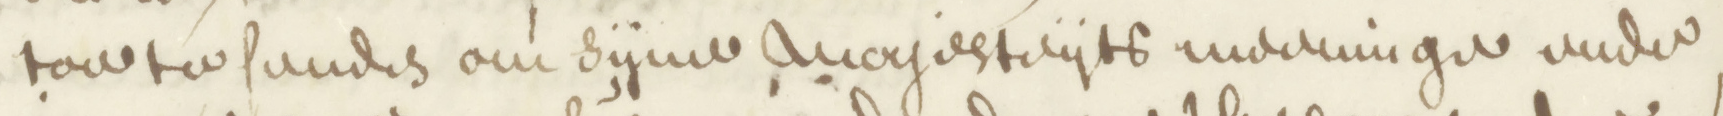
toe te senden om sijne Majesteijts meeninge ende
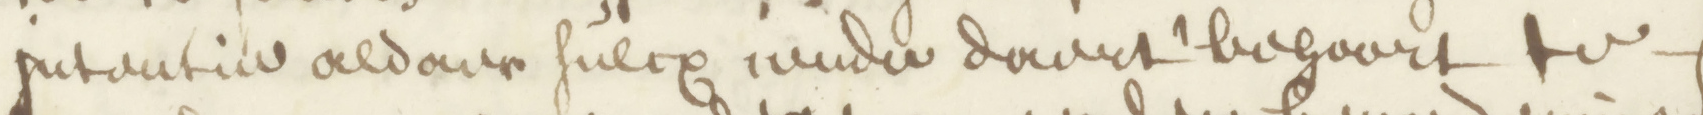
intentie aldaer sulcx ende daert' behoort te
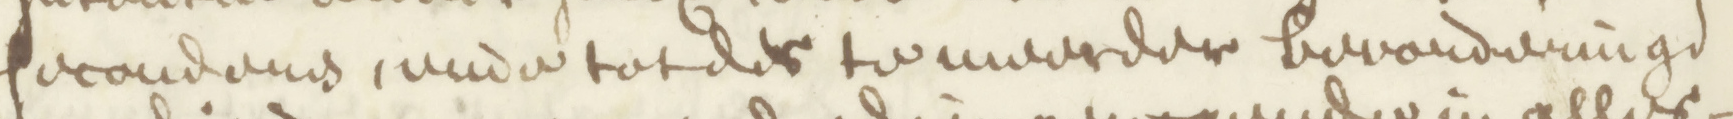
seconderen, ende tot des te meerder bevorderinge
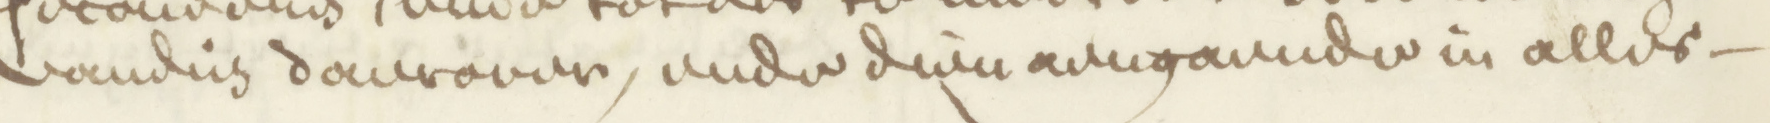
vandien daerover, ende dien aengaende in alles
